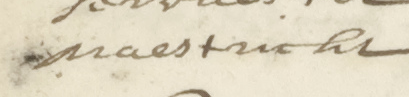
Maestricht
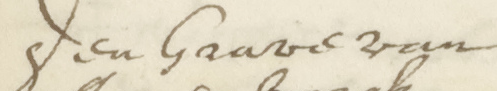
Den Grave van
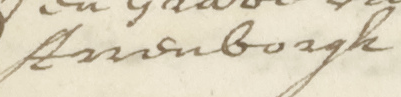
Arrenborgh
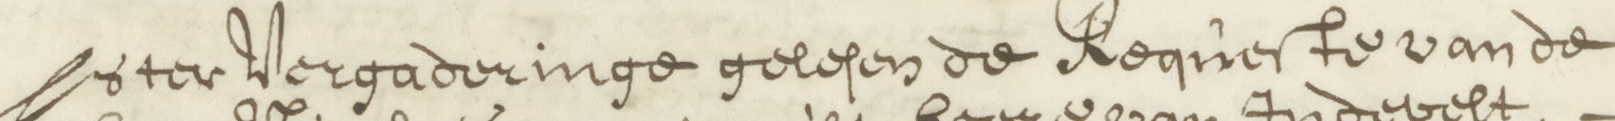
Is ter Vergaderinge gelesen de Requeste van de
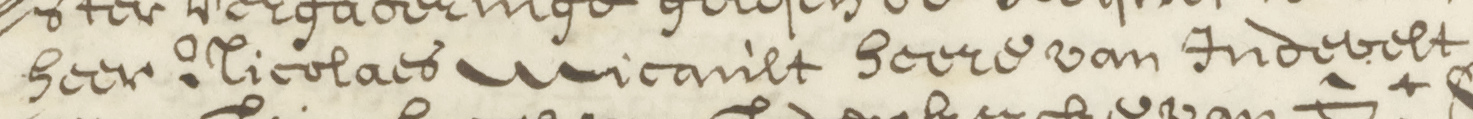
heer Nicolaes Micault heere van Indevelt
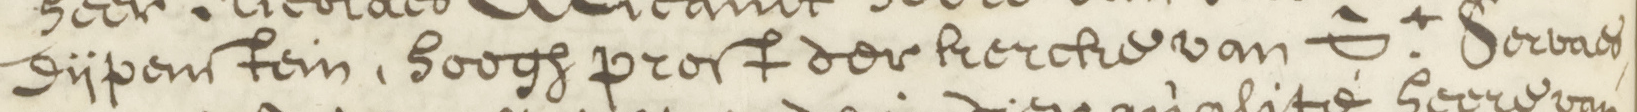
Dijpenstein, hoogh prost der kercke van St. Servaes
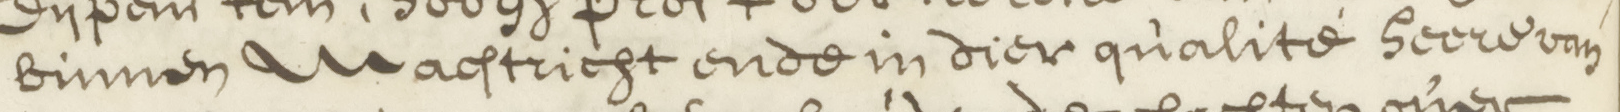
binnen Maestricht ende in dier qualite heere van
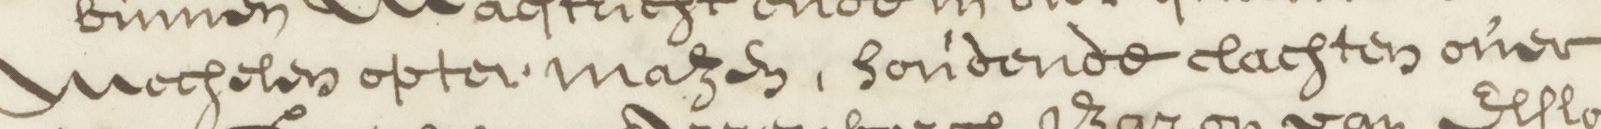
Mechelen opter Mazen, houdende clachten over
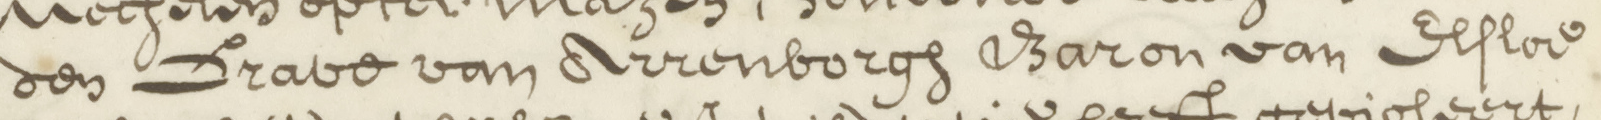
den Grave van Arrenborgh Baron van Elsloe
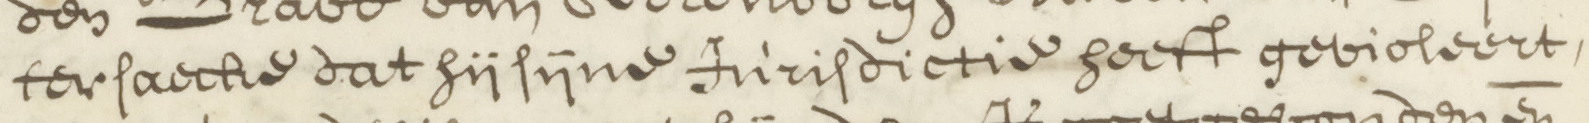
ter saecke dat hij sijne Jurisdictie heeft gevioleert.
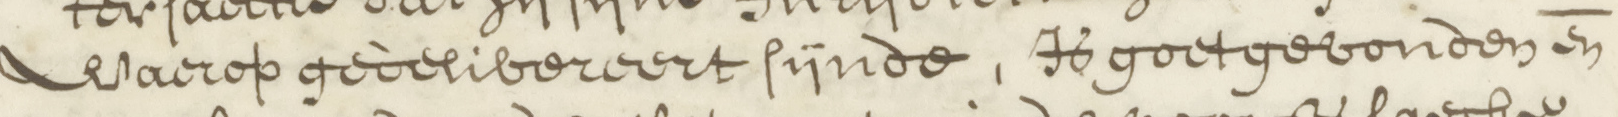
Waerop gedelibereert sijnde, Is goetgevonden en
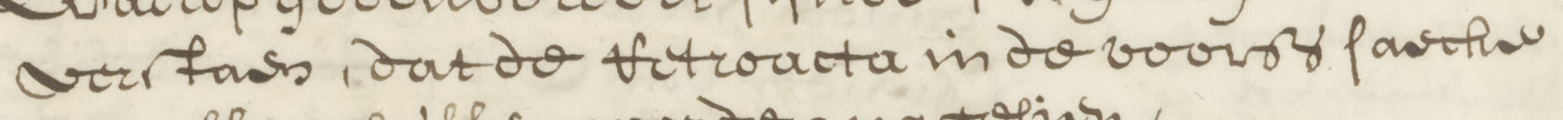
verstaen, dat de Retroacta in de voors saecke
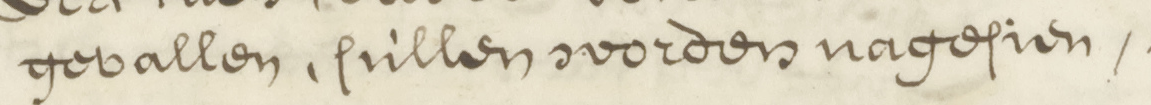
gevallen, sullen worden nagesien.
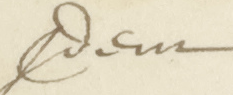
Idem
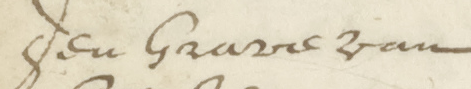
Den Grave van
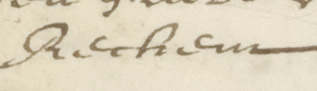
Reckem
